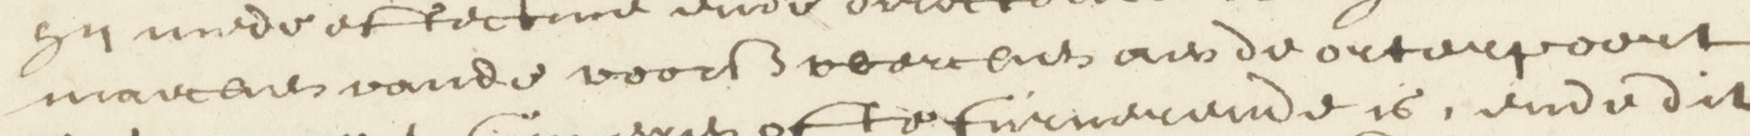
maecken vande voors wercken aen de orterpoort
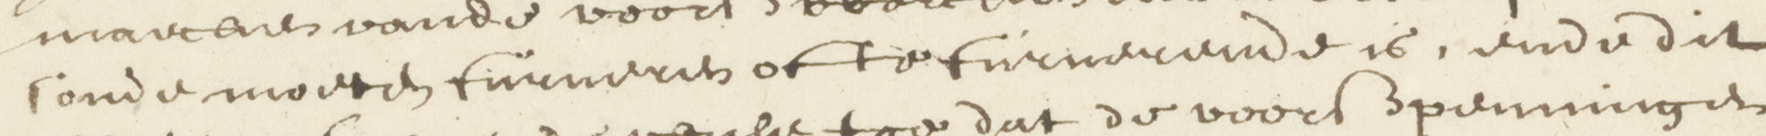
soude moeten furneren ofte furnerende is, ende dit
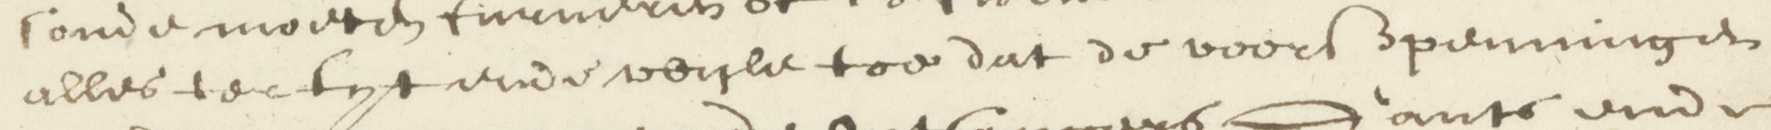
alles ter tyt ende wyle toe dat de voors penningen
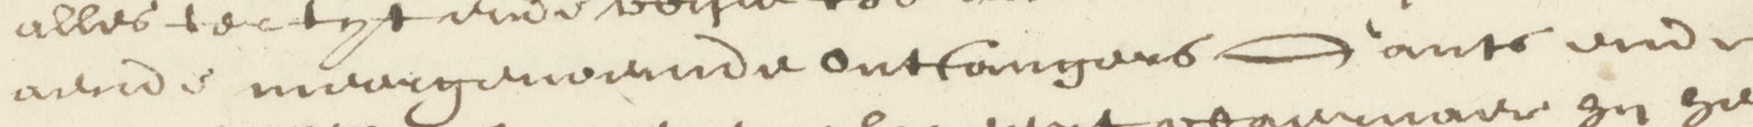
aende meergenoemde ontfangers Gants ende
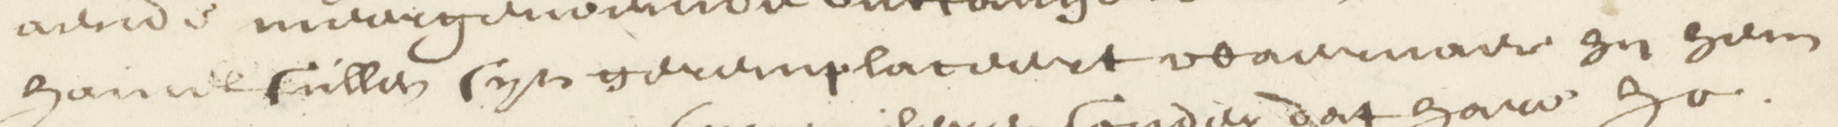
hamel sullen syn geremplaceert waernaer hy hem
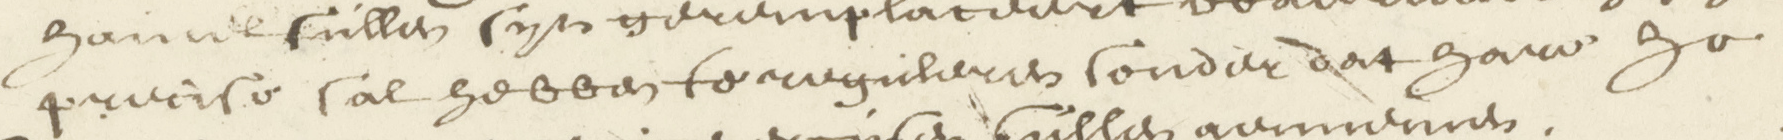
precise sal hebben te reguleren sonder dat hare Ho:
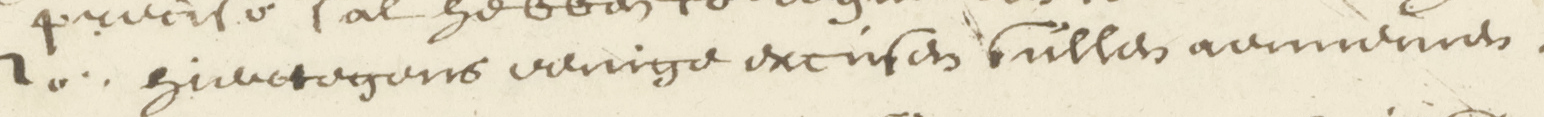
Mo: hiertegens eenige excusen sullen aennemen
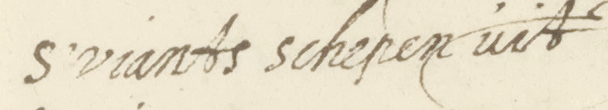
s'viants schepen uit
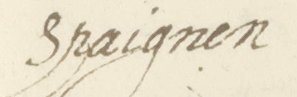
Spaignen
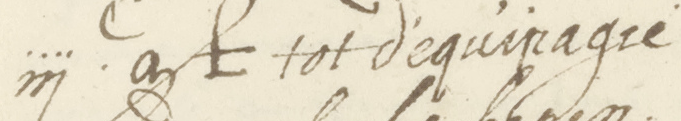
iijC. m L. tot d'equipagie
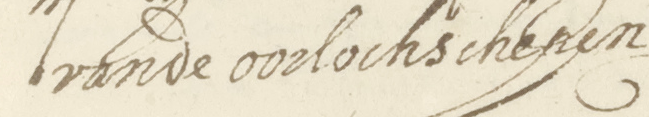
vande oorlochschepen
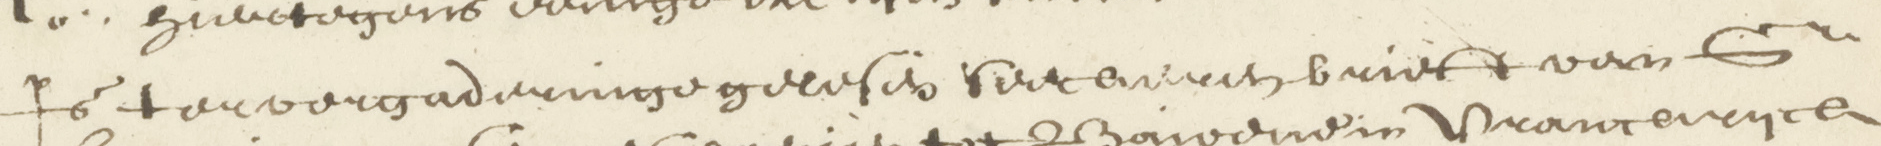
Is ter vergaderinge gelesen seeckeren brieff van Sr
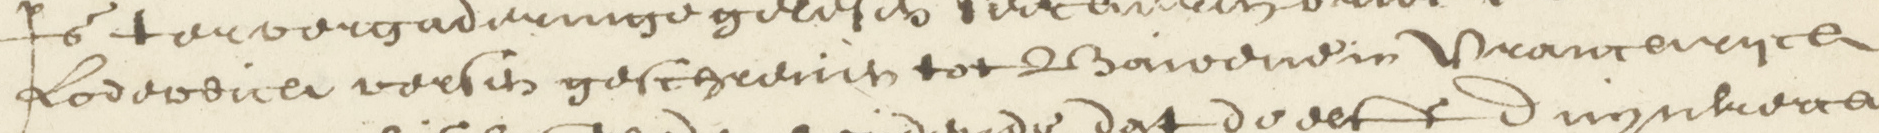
Lodewick versen geschreven tot Baioene in Vranckryck
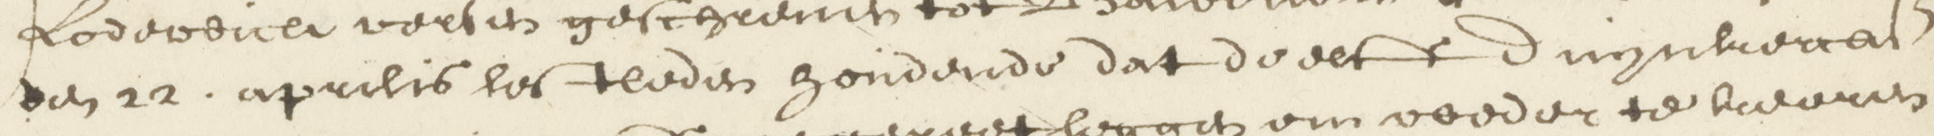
den 22. aprilis lestleden houdende dat de elff Duynkerckse
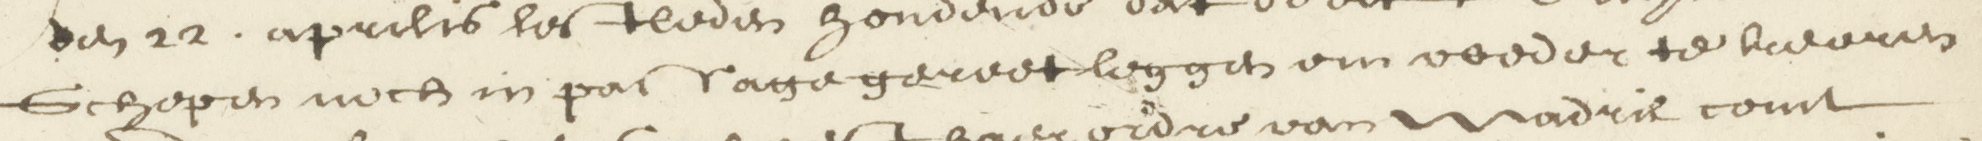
Schepen noch in passage gereetleggen om weder te keeren
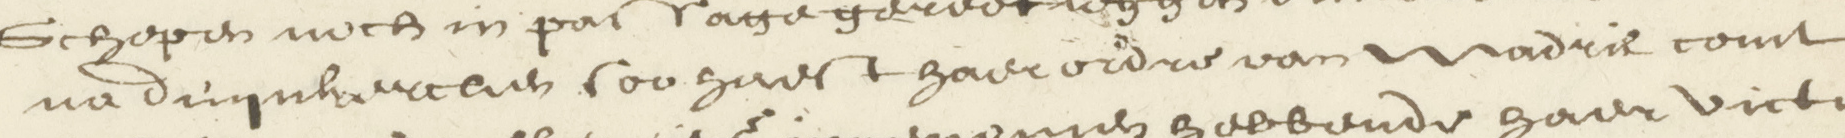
na Duynkercken soo haest haer ordre van Madrid comt
